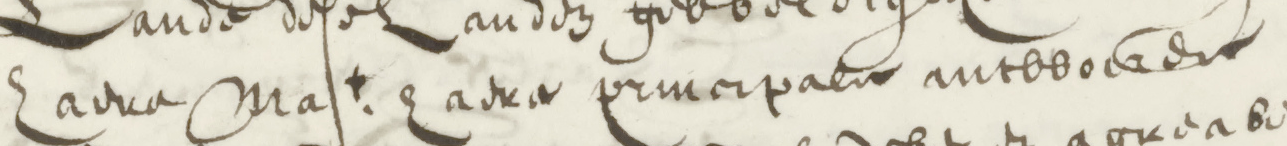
haere Mat haere principale antwoorde
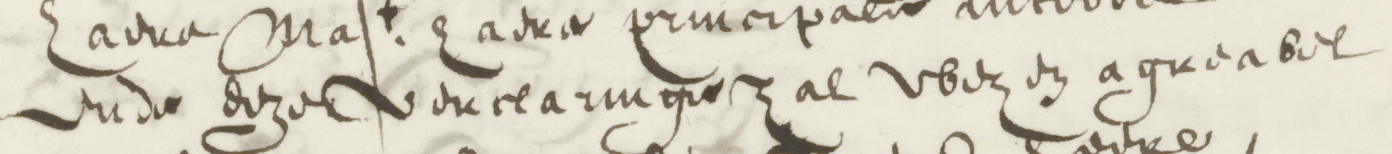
ende deze verclaringe zal wezen agreabel
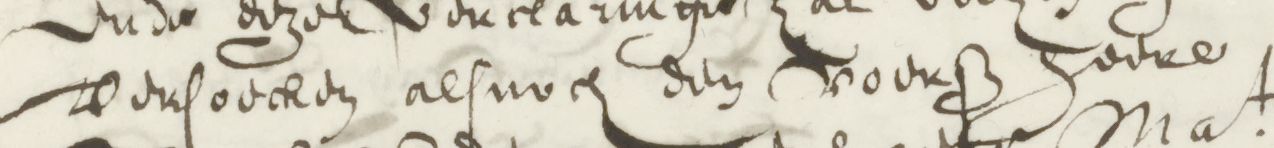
versoecken alsnoch den voers heere
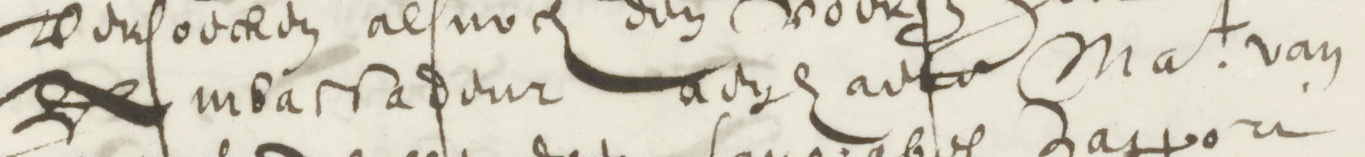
Ambassadeur aen haere Mat van
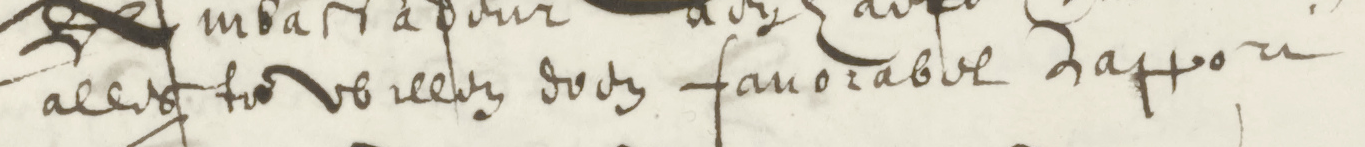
alles te willen doen favorabel rapport.
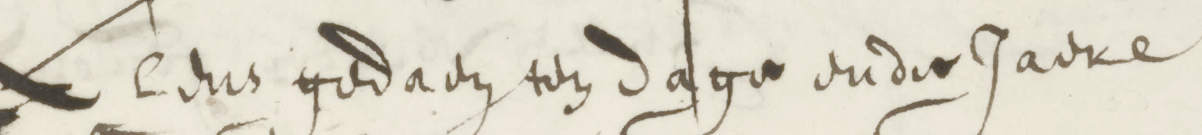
Aldus gedaen ten dage ende jaere
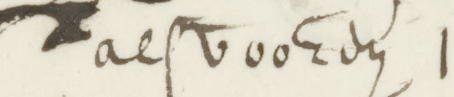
als vooren.
